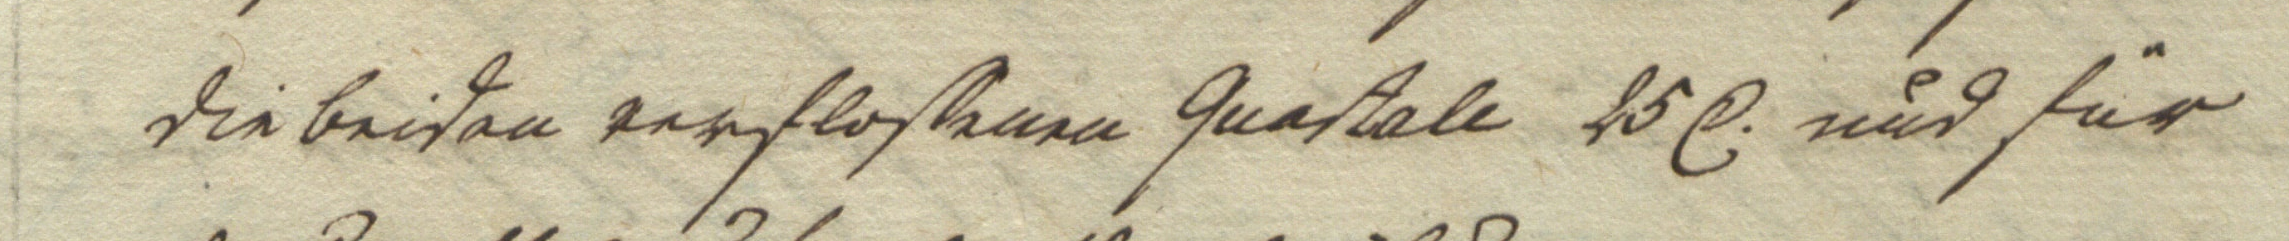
die beiden verflossenen Quartale 25 rtl. und für
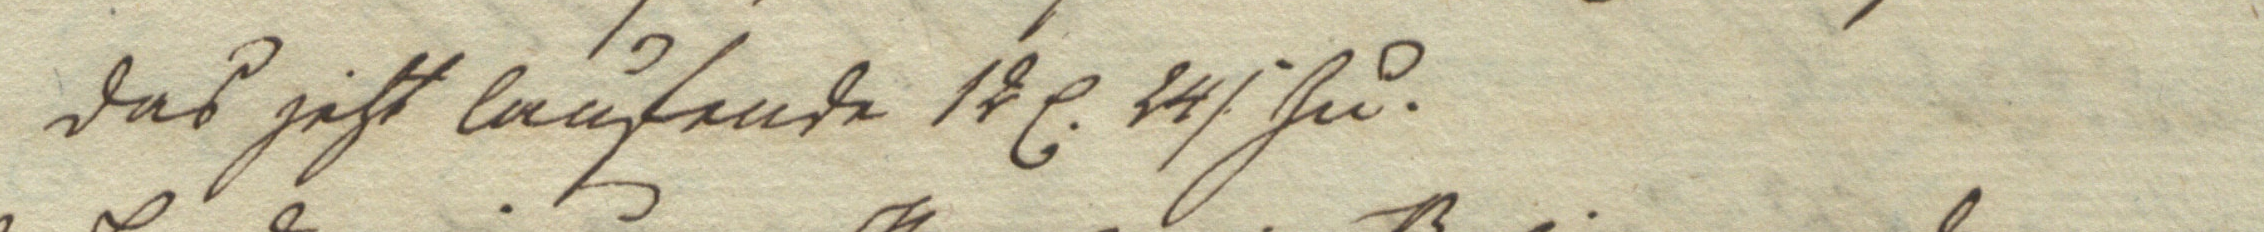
das jetzt laufende 12 rtl. 24s zu.
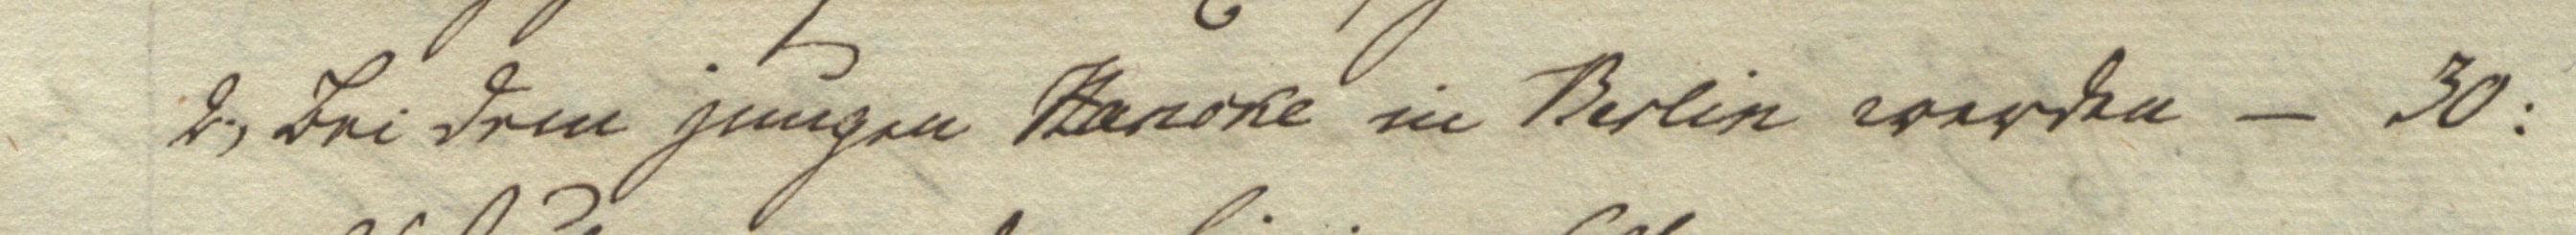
2., Bei dem jungen Hancke in Berlin werden - 30.
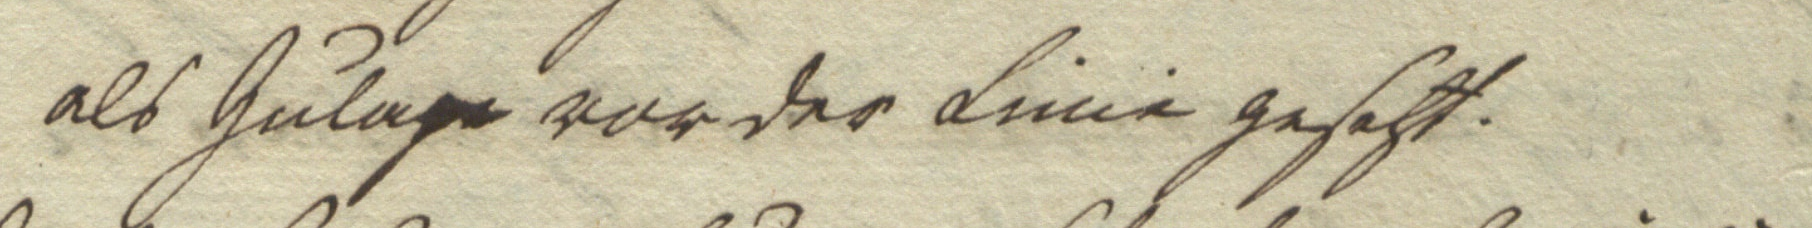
als Zulage vor der Linie gesetzt.
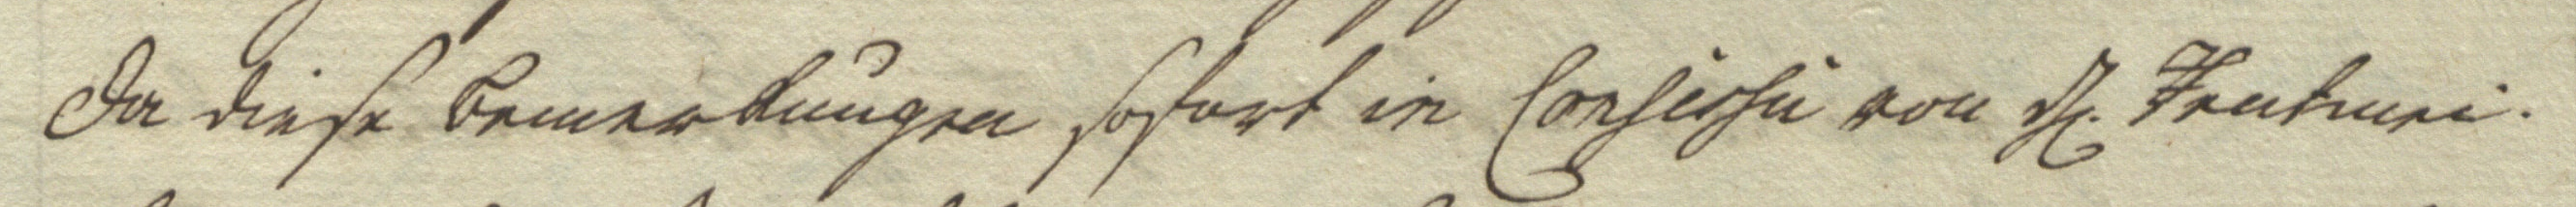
Da diese Bemerkungen sofort in Consessu von dh. Rentmei¬
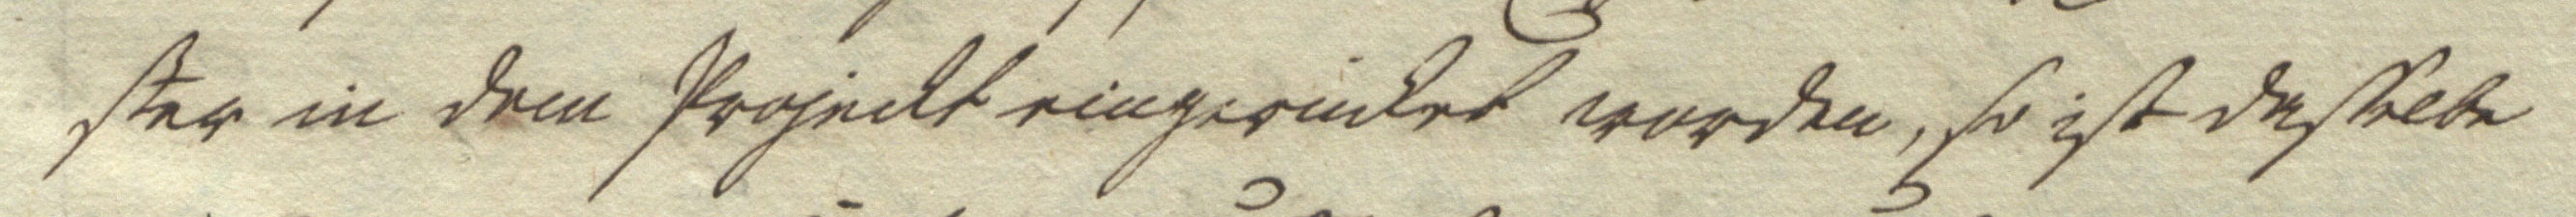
ster in dem Projekt eingerücket worden, so ist dasselbe
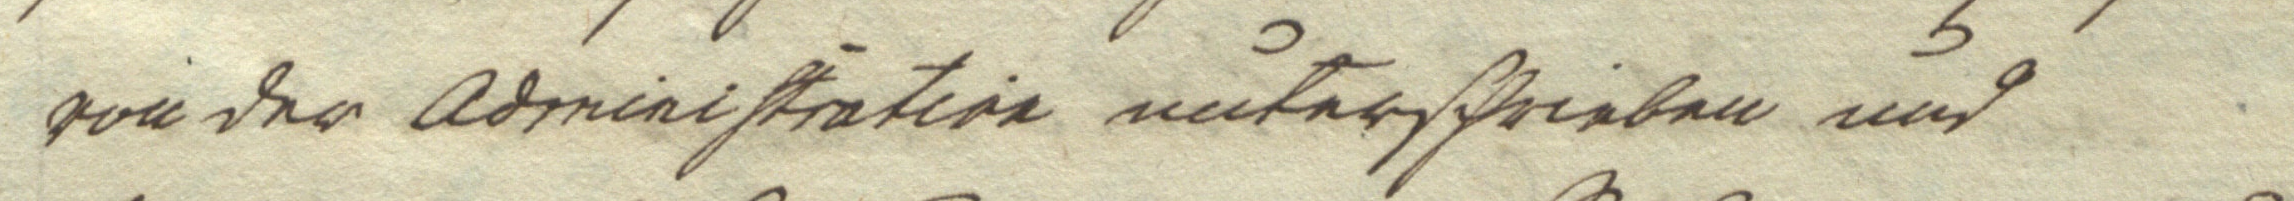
von der Administration unterschrieben und
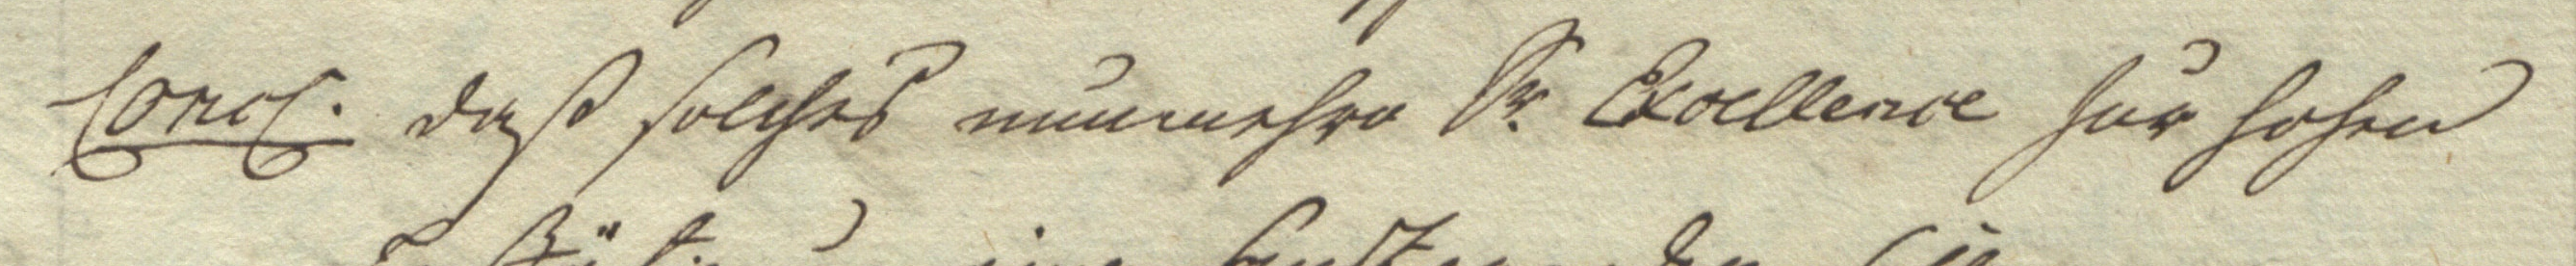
Concl. daß solches nunmehro Sr. Excellence zur hohen
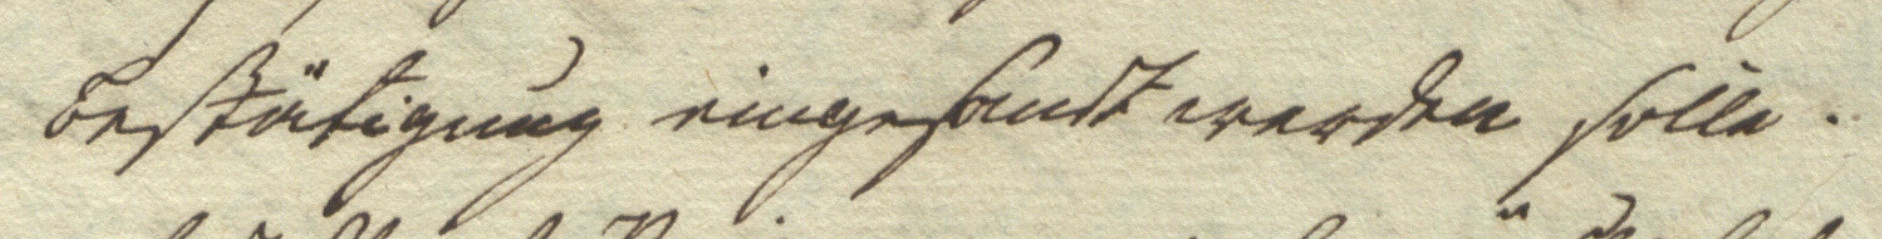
Bestätigung eingesandt werden solle.
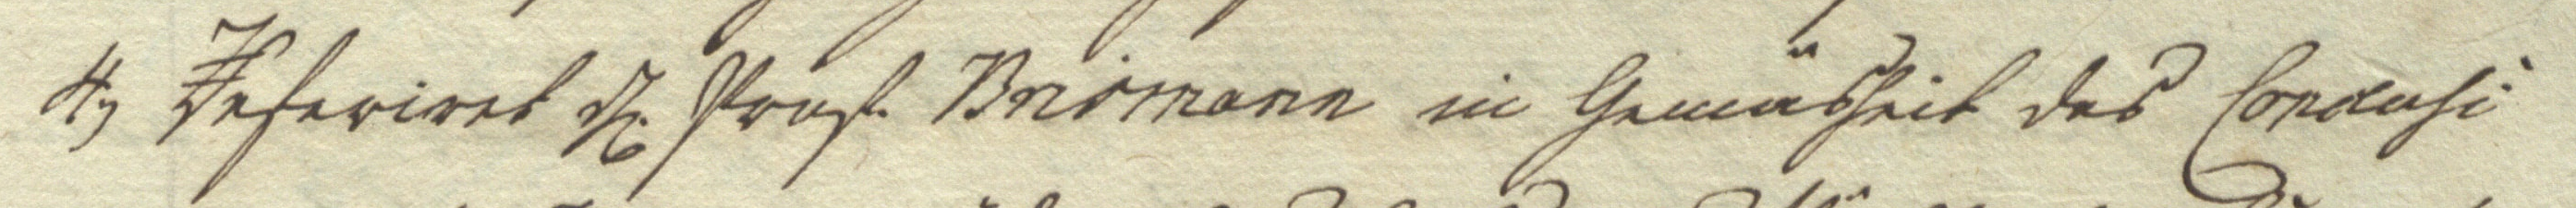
4., Referiret dh. Prof. Brismann in Gemäsheit des Conclusi
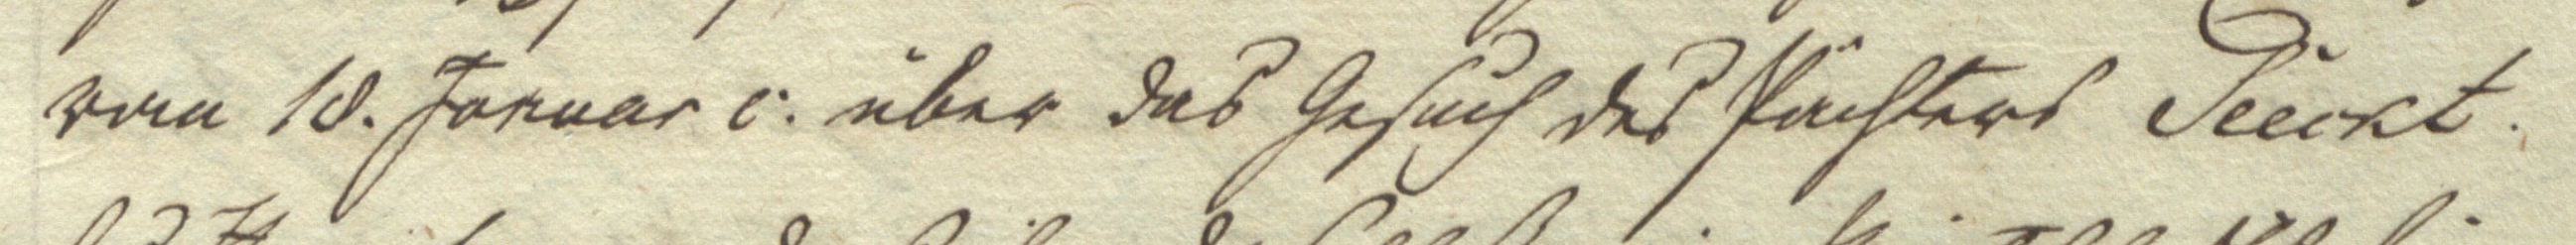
vom 18. Januar c. über das Gesuch des Pächters Seeckt
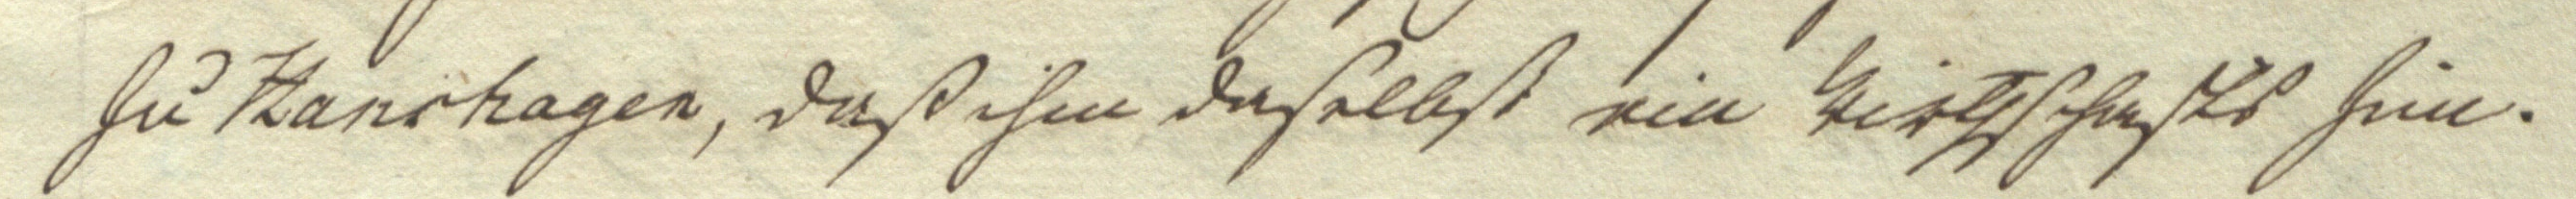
zu Hanshagen, daß ihm daselbst ein Wirthschafts Zim¬
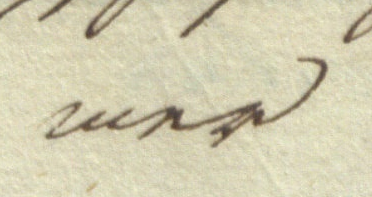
mer
